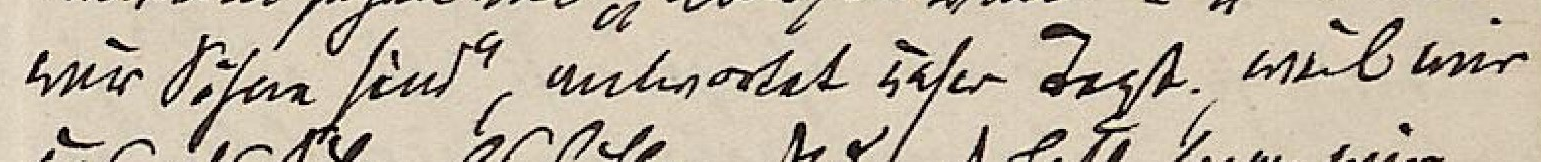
wir Söhne sind" antwortet unser Text, weil wir
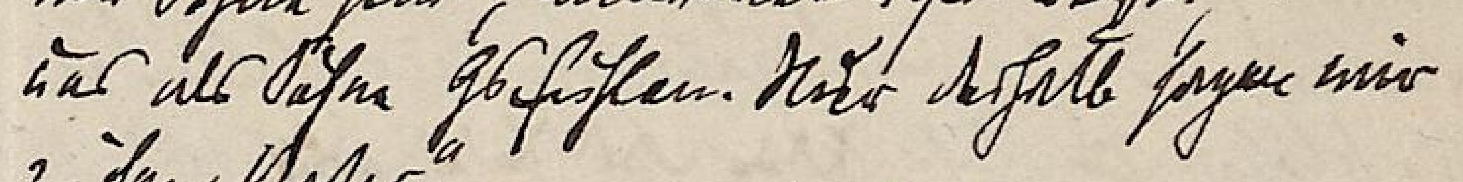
uns als Söhne Gs fülen. Nur deshalb sagen wir
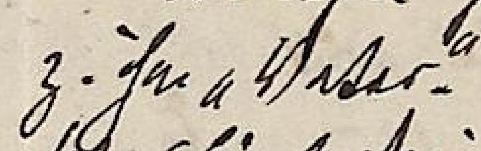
z. ihm "Vater."
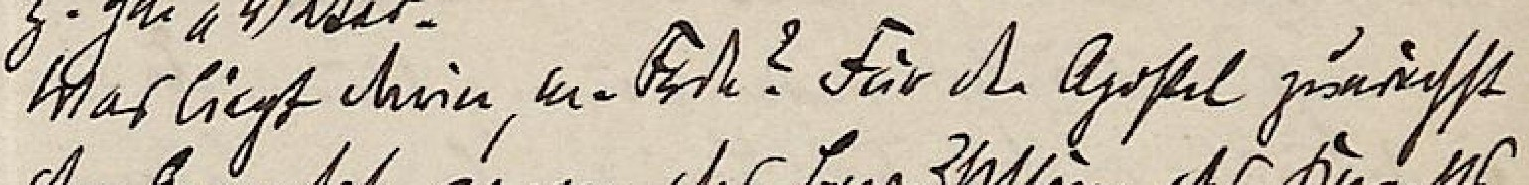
Was liegt darin, m. Frde? Für den Apostel zunächst
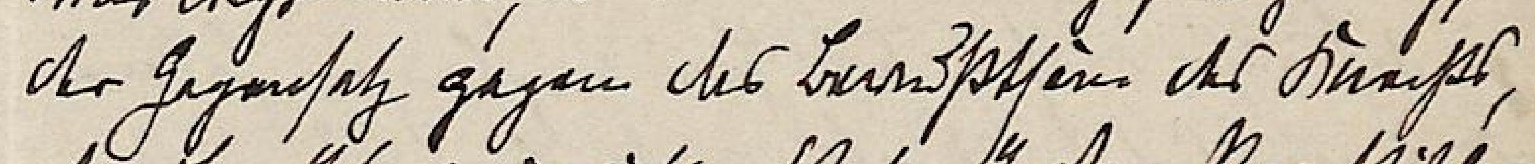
der Gegensatz gegen das Bewußtsein des Knechts,
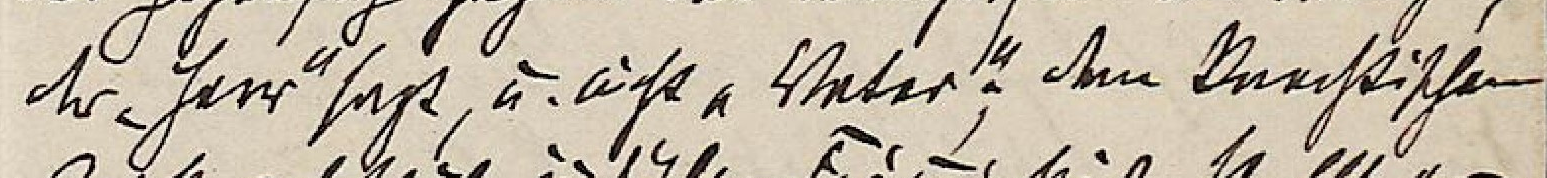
der "Herr" sagt, u. nicht "Vater." dem knechtischen
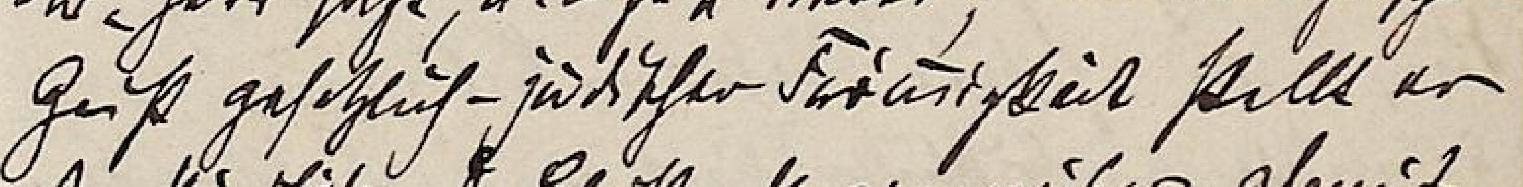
Geist gesetzlich-jüdischer Frömigkeit stellt er
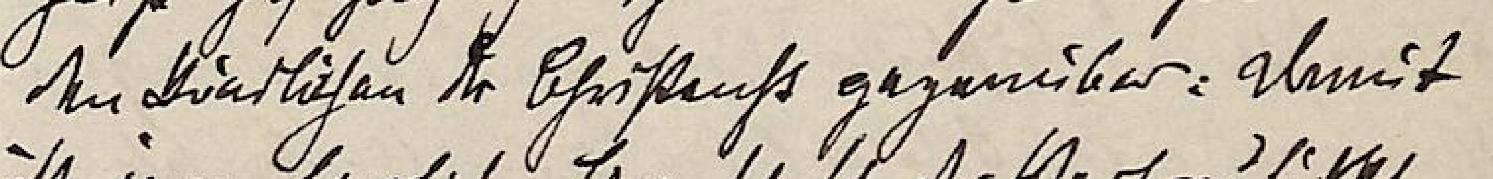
den kindlichen d. Christenht gegenüber: Damit
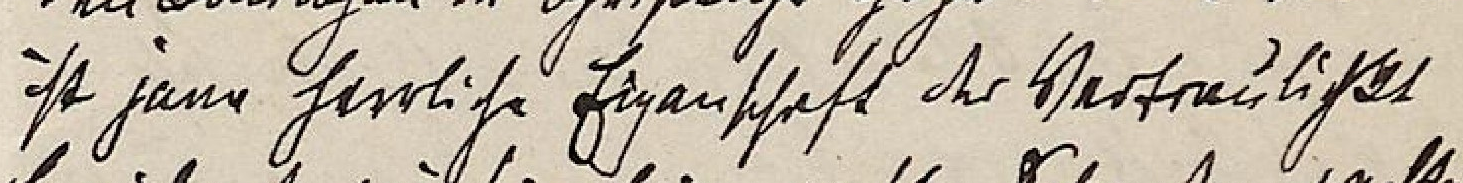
ist jene herrliche Eigenschaft der Vertraulichkt
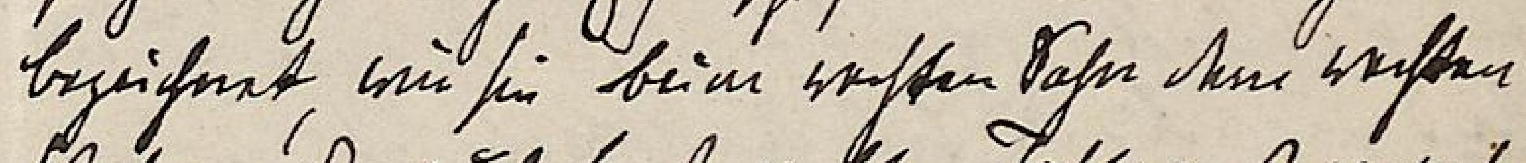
bezeichnet, wie sie beim rechten Sohn dem rechten
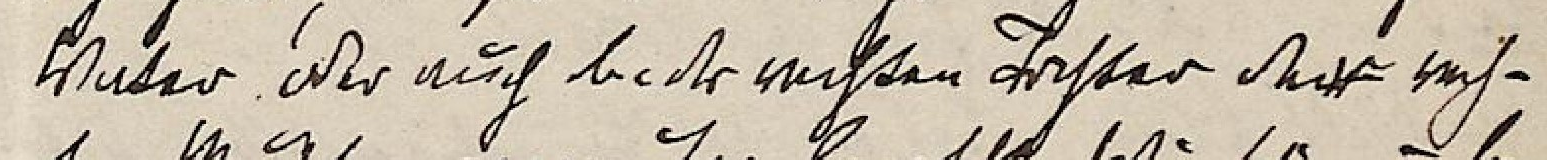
Vater der auch bei der rechten Tochter der rech¬
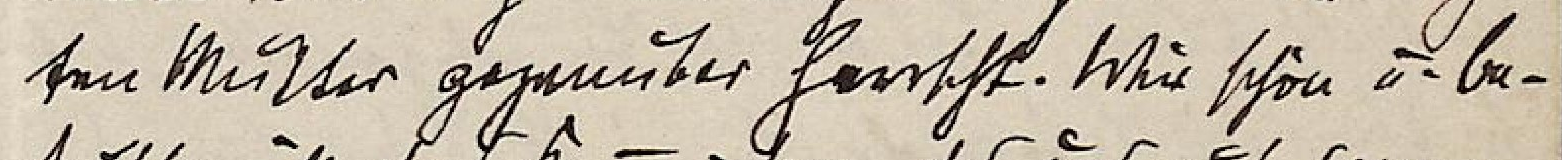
ten Mutter gegenüber herrscht. Wie schön u. be¬
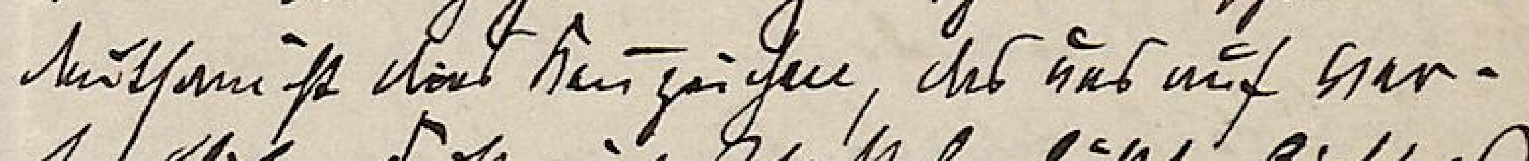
deutsam ist dieses Kenzeichen, das uns auf ver¬
